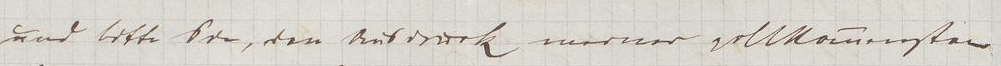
und bitte Sie, den Ausdruck meiner vollkommensten
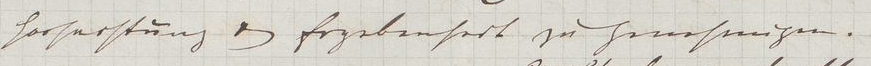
Hochachtung & Ergebenheit zu genehmigen.
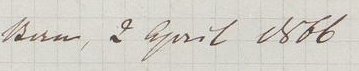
Bern, 2 April 1866
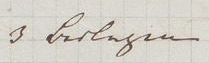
3 Beilagen
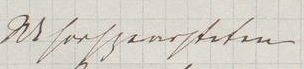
M hochgeachteten
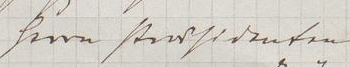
Herrn Präsidenten
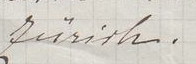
Zürich.
